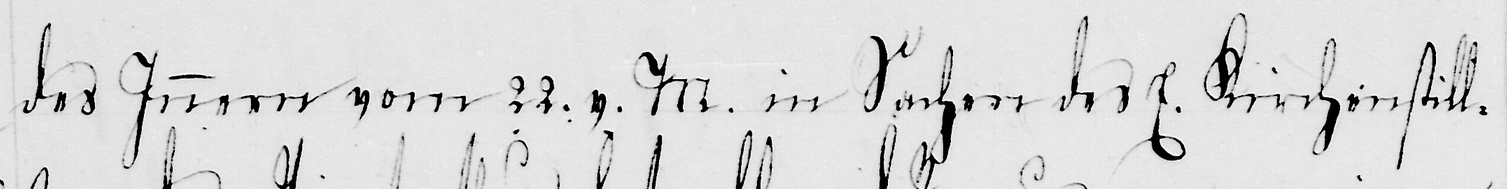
des Innern vom 22. v. M. in Sachen des E. Kirchenstill¬
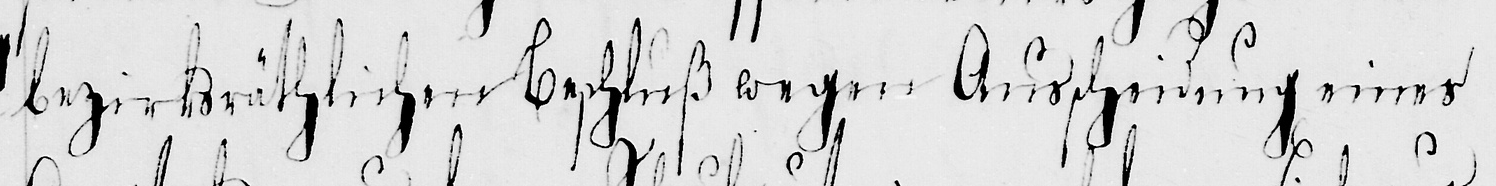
bezirksräthlichen Beschluß wegen Ausscheidung eines
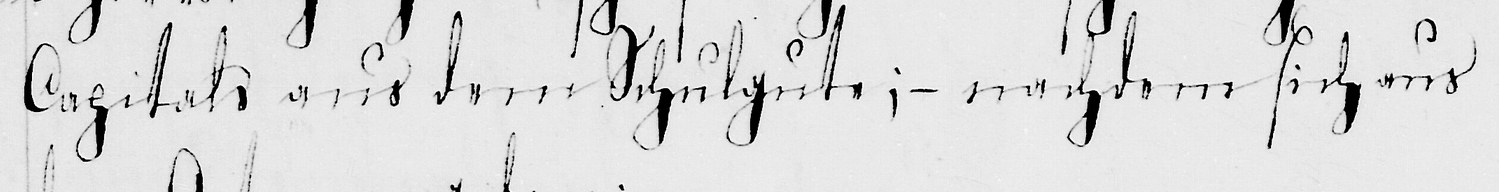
Capitals aus dem Schulgute; – nachdem sich aus
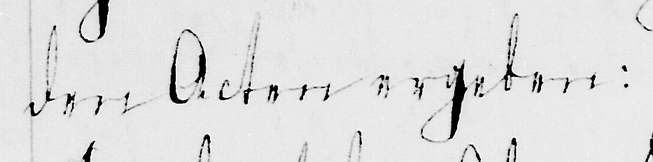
den Acten ergeben:
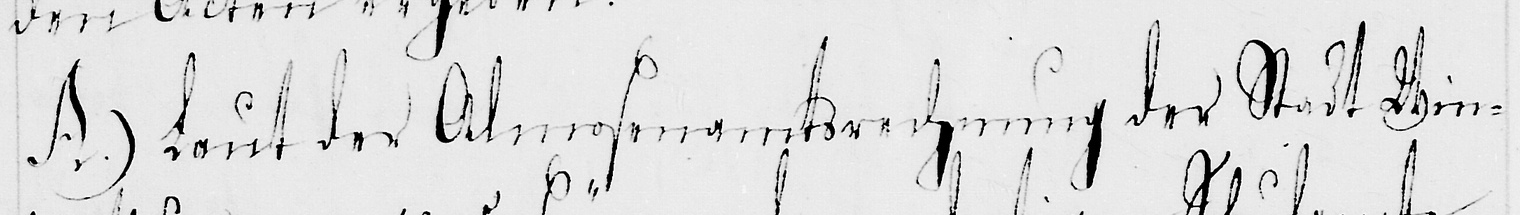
A.) Laut der Almosenamtsrechnung der Stadt Win¬
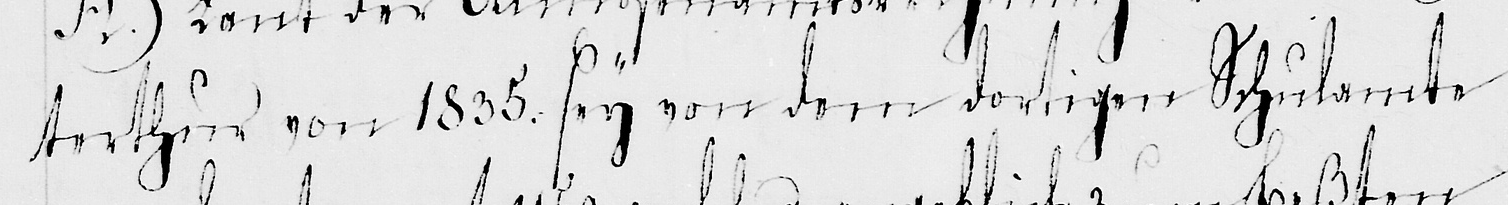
terthur von 1835. sey von dem dortigen Schulamte
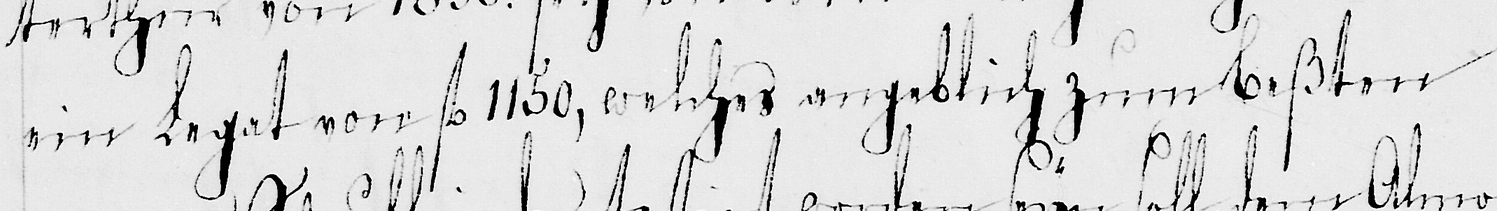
ein Legat von fl. 1150, welches angeblich zum beßten
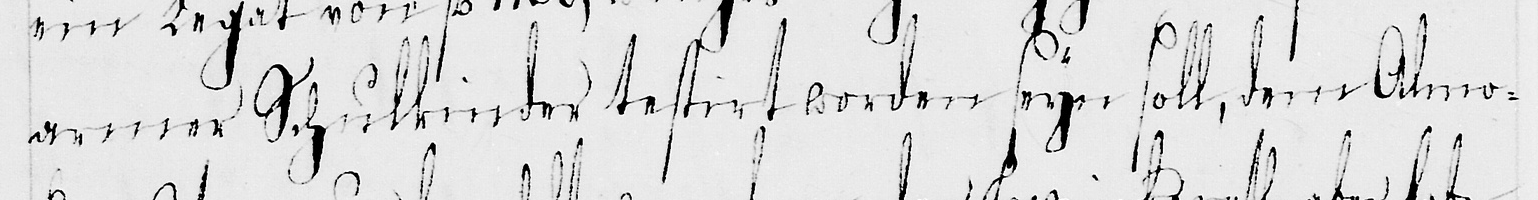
armer Schulkinder testirt worden seyn soll, dem Almo¬
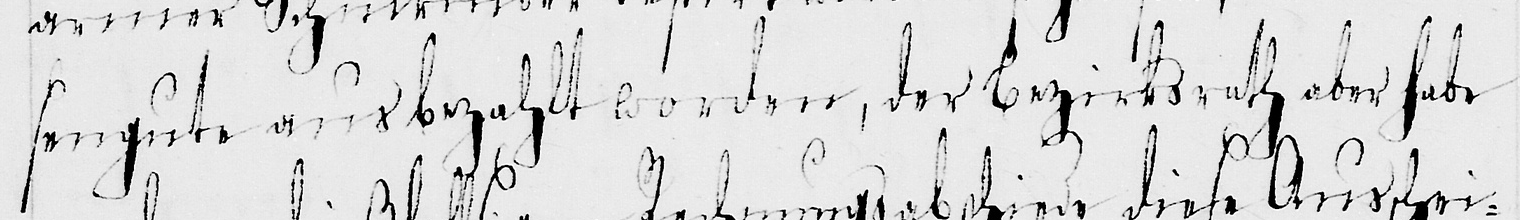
sengute ausbezahlt worden, der Bezirksrath aber habe
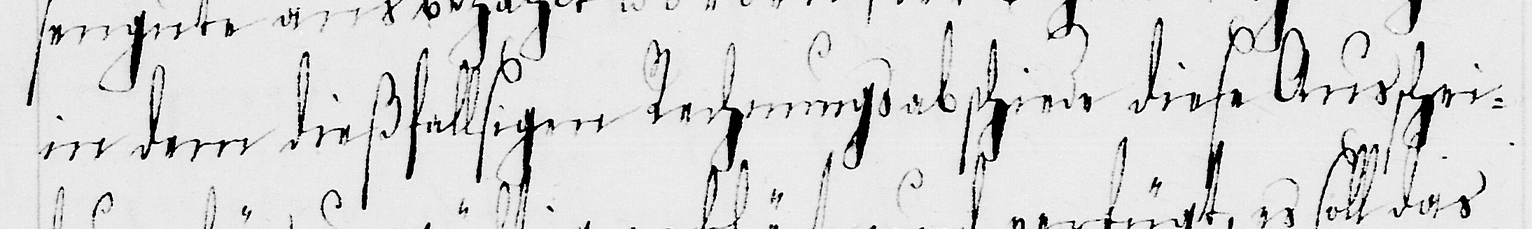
in dem dießfallsigen Rechnungsabschiede diese Ausschei¬
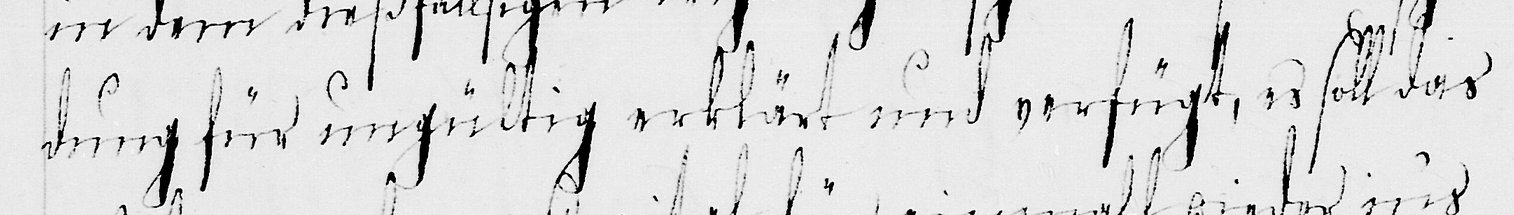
dung für ungültig erklärt und verfügt, es soll das
